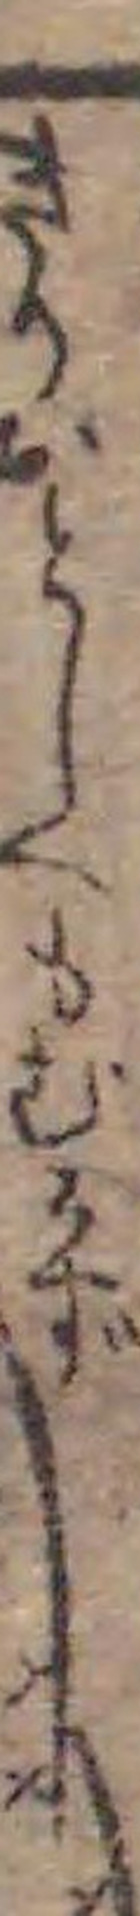きりおとしへもむかず
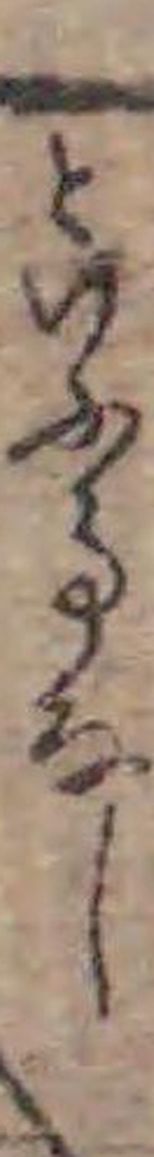といふ事なし
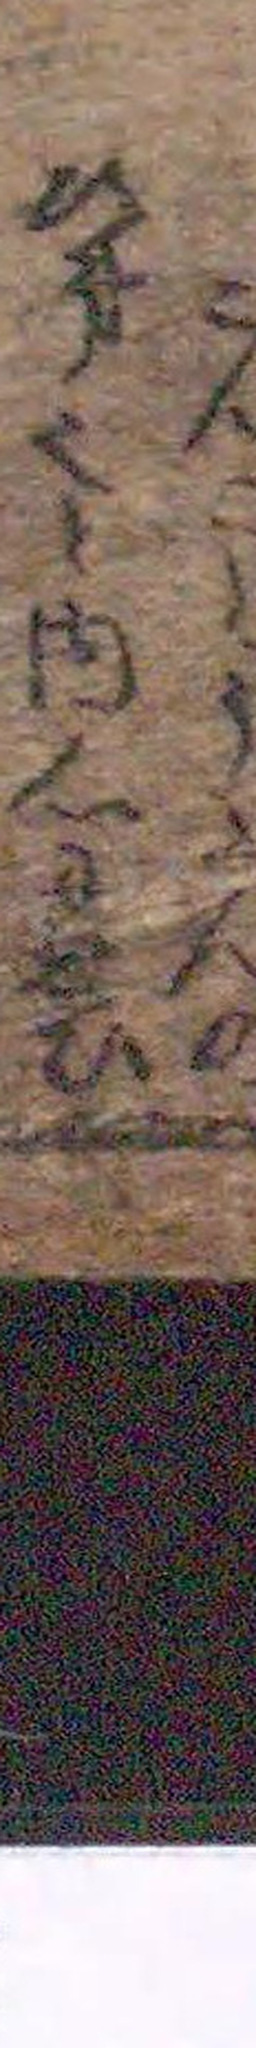次第なりと内心に思ひ
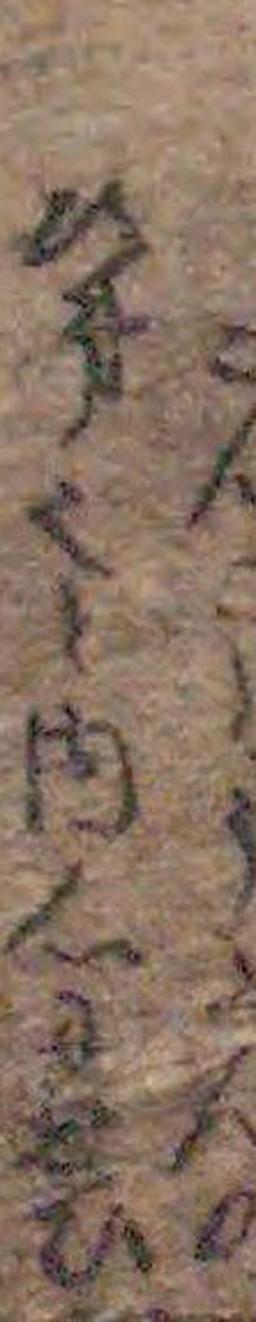次第なりと内心に思ひ
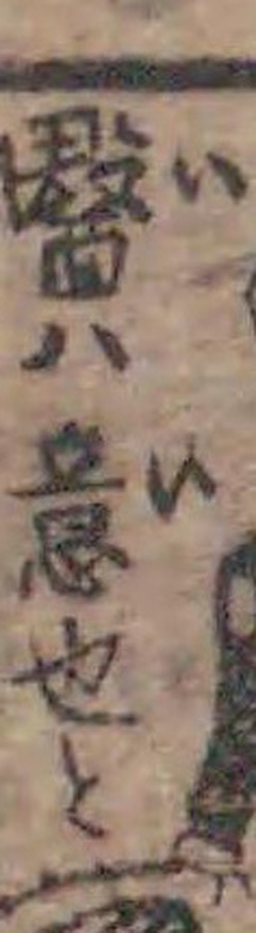医は意也と
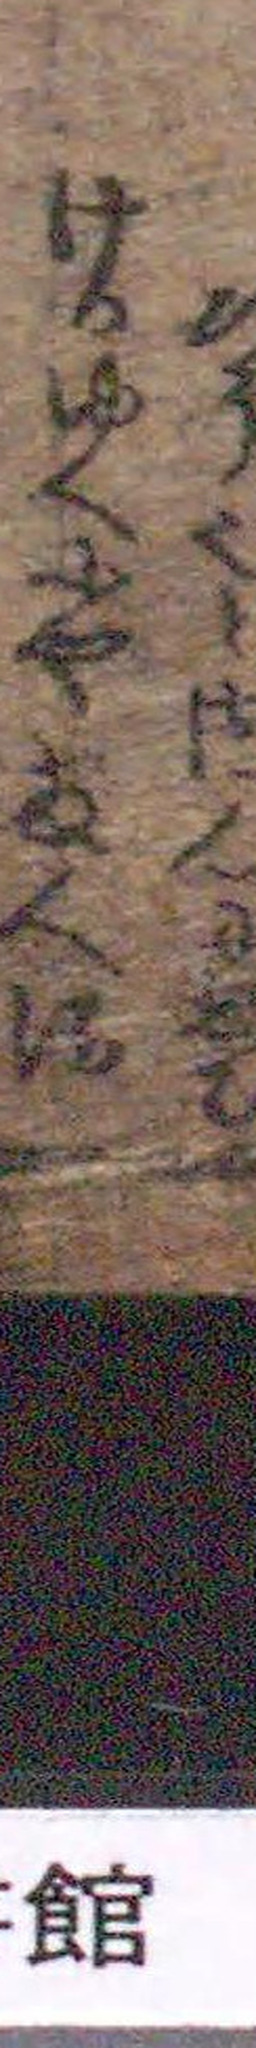けるゆへにや両人酒
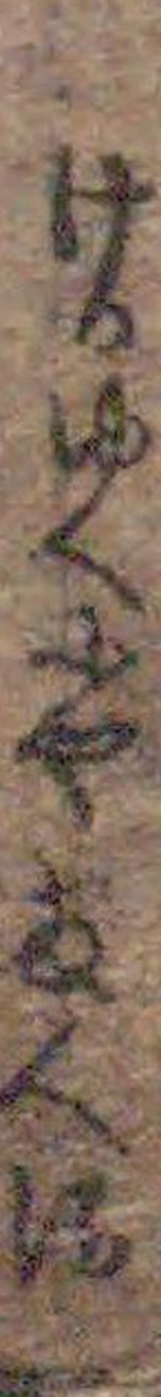けるゆへにや両人酒
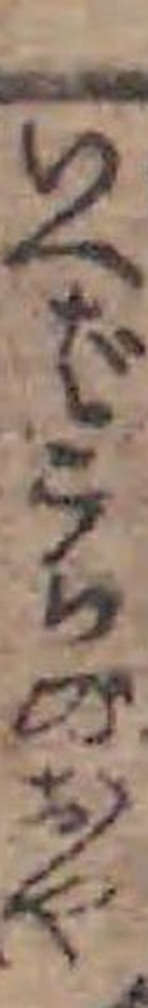いへばこちのおや
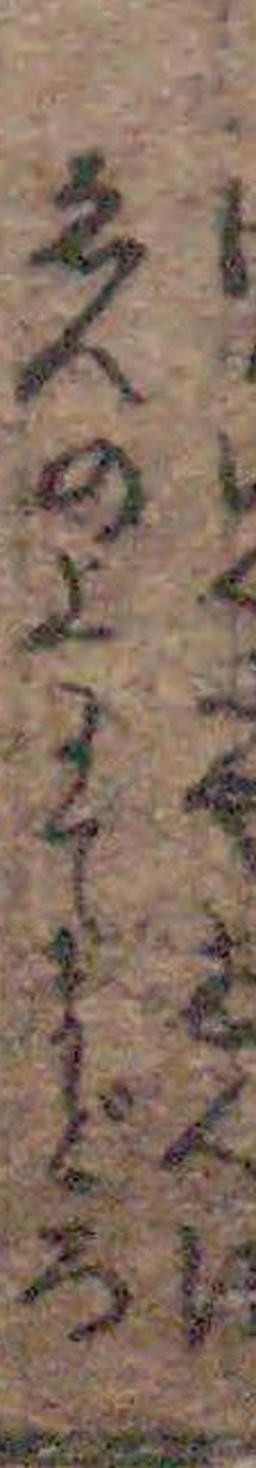ゑんの上にてまどろ
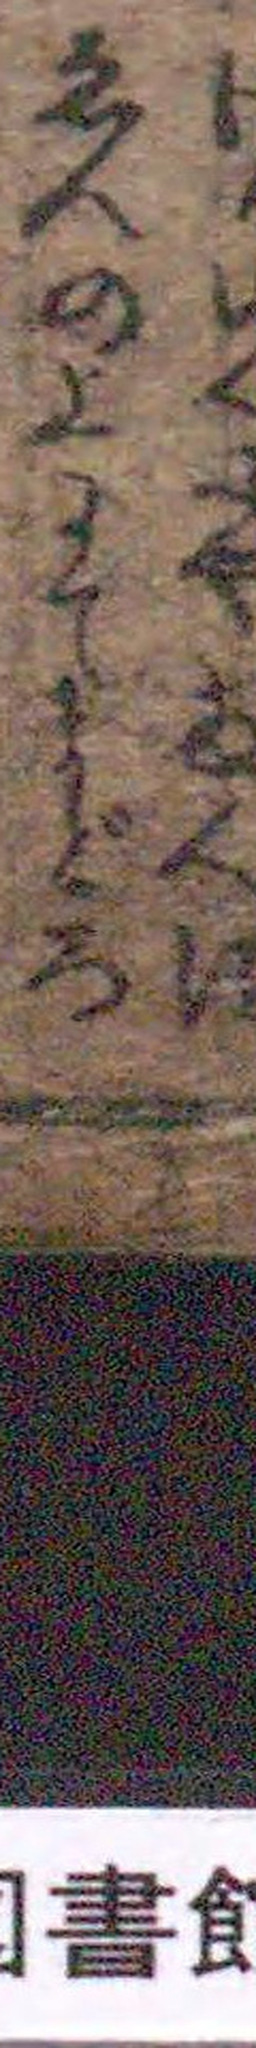ゑんの上にてまどろ
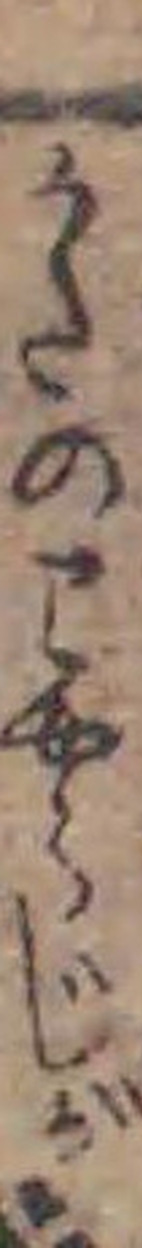かたのりやうじが
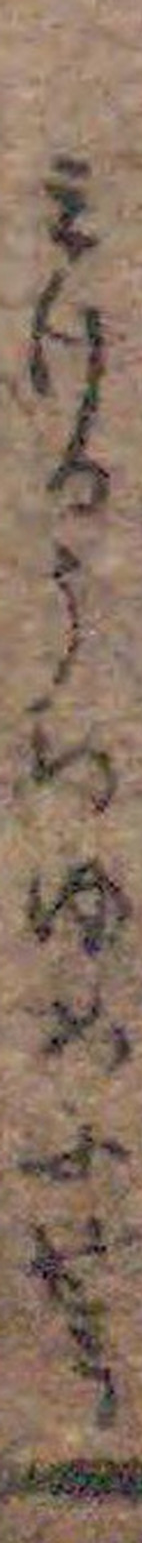みけるうちゆめにせう
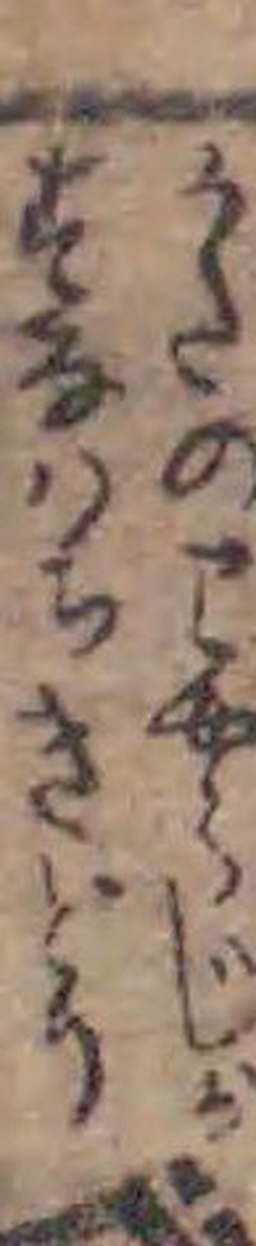すなはちきどり
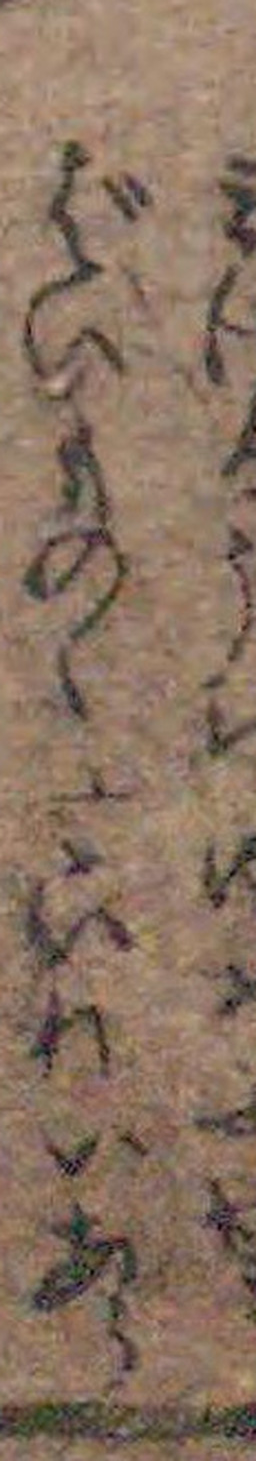ばいものゝせいれいあら
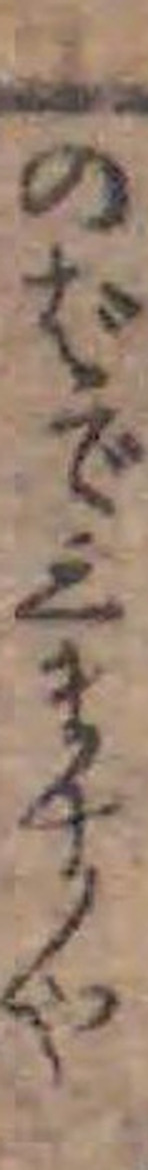のばで三ますや
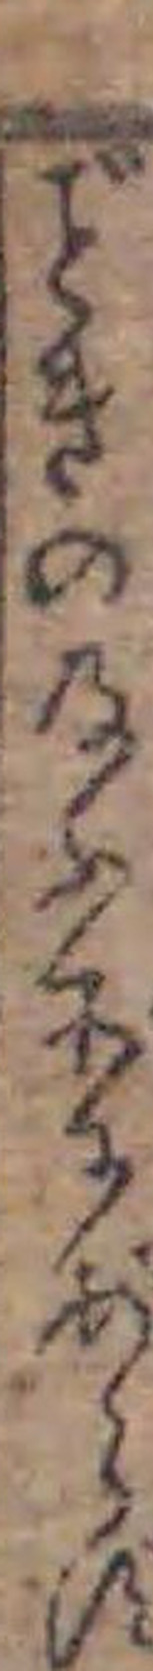ごときの及ふ所にあらず
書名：三舛増鱗組 : 3巻
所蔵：国立国会図書館 National Diet Library, JAPAN
